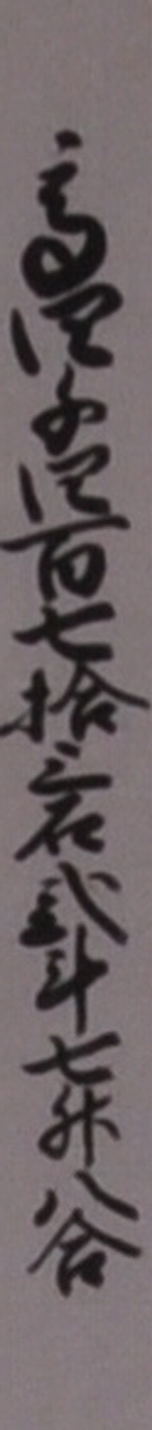高四千四百七拾三石二斗七升八合
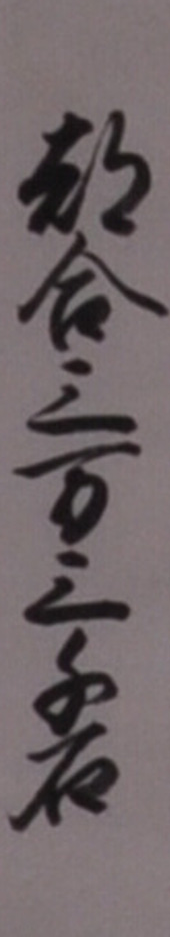都合三万三千石
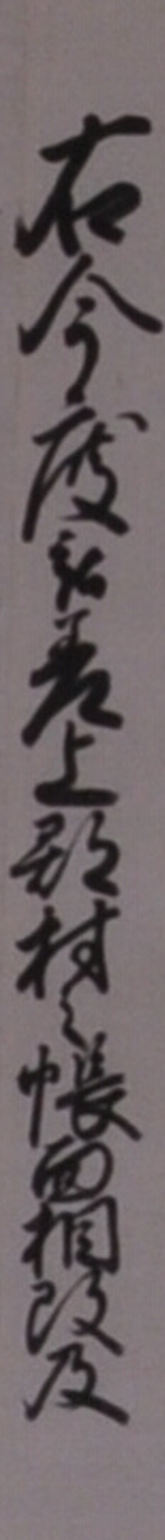右今度被差上郡村之帳面相改及
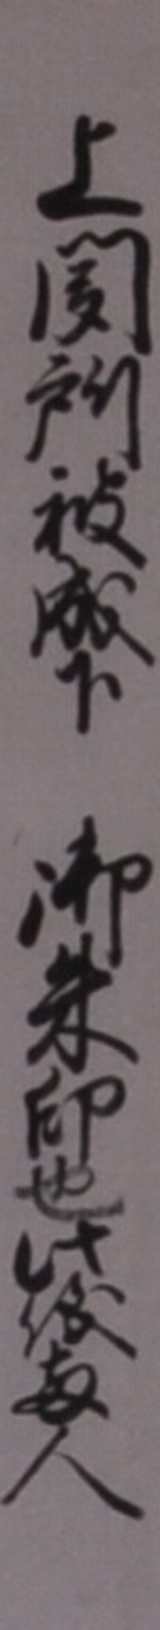上聞所被成下御朱印也此儀両人
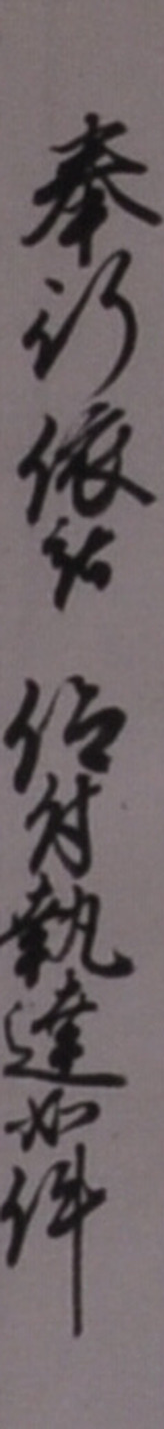奉行依被仰付執達如件
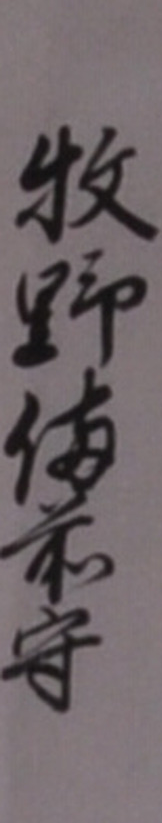牧野備前守
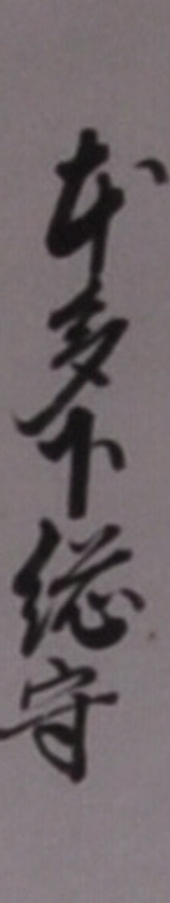本多下総守
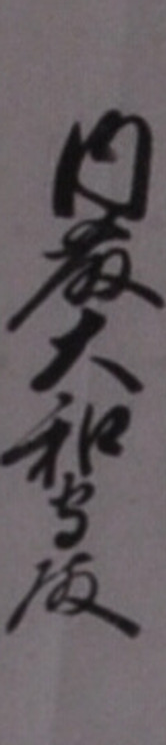内藤大和守殿
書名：御朱印写・領地目録
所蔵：伊那市立高遠町図書館・合同会社AMANE
